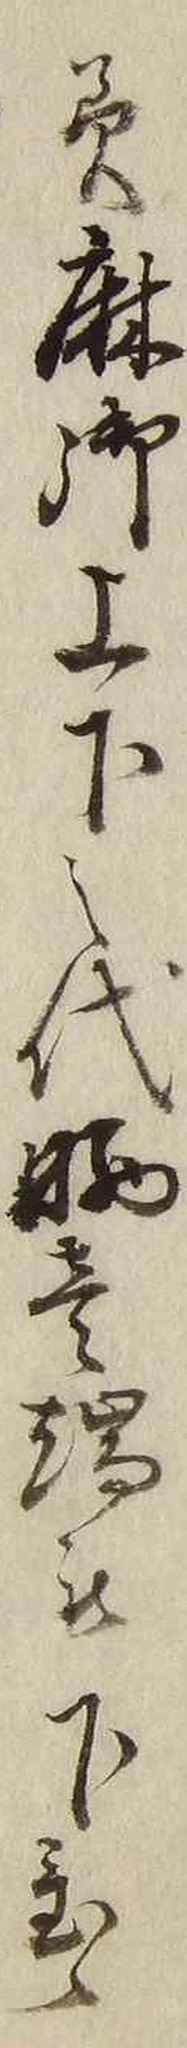美麻御上下之代晒壱端被下置候
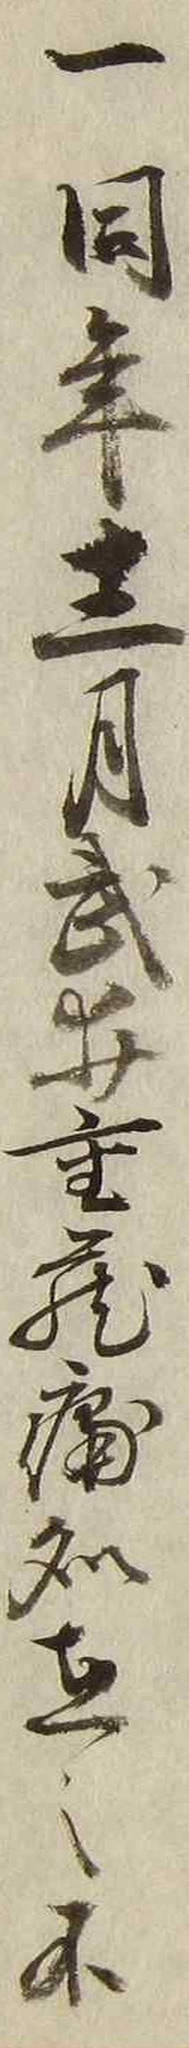一同年十二月武井重蔵痛処在之不
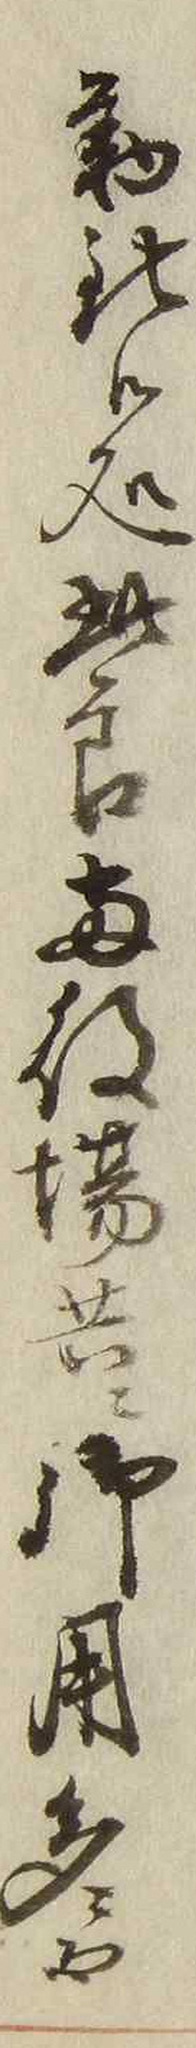勤致候処此節両役場共ニ御用多ニ而

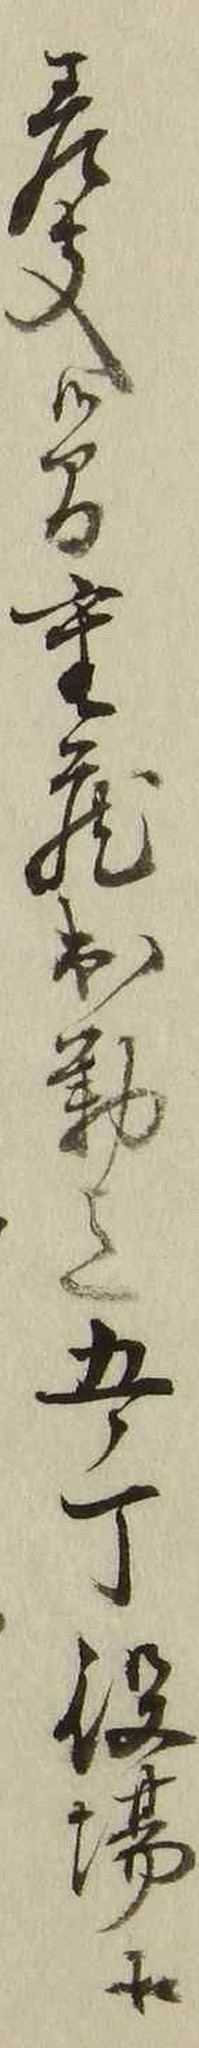差支候間重蔵出勤迄五ノ丁役場江
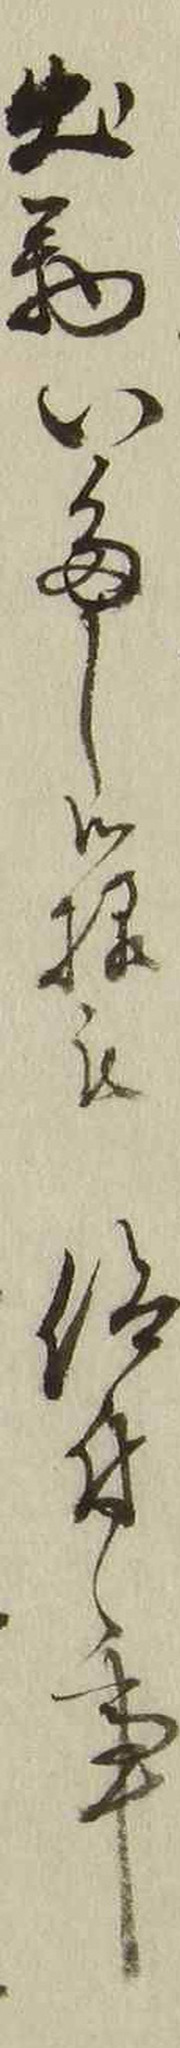出勤いたし候様被仰付候事
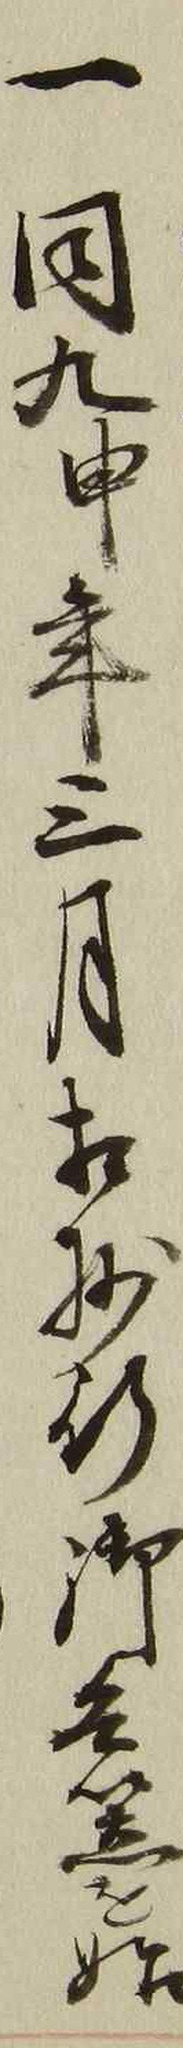一同九申年三月相州行御兵器を始
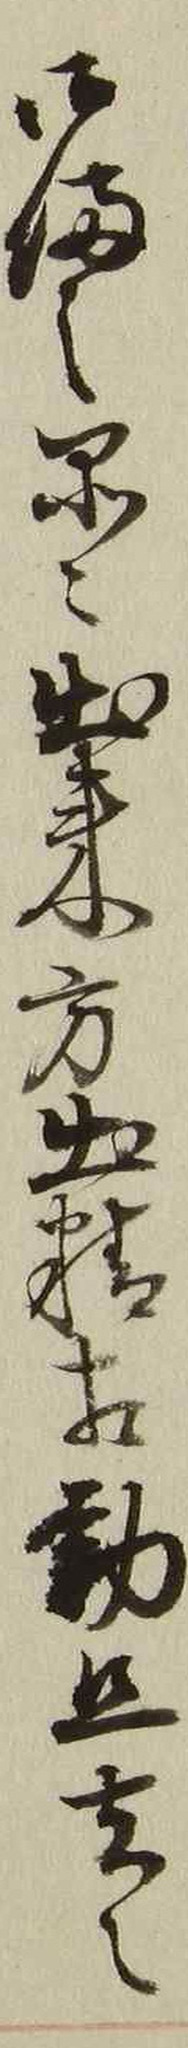御備之品々出来方出精相勤且去々
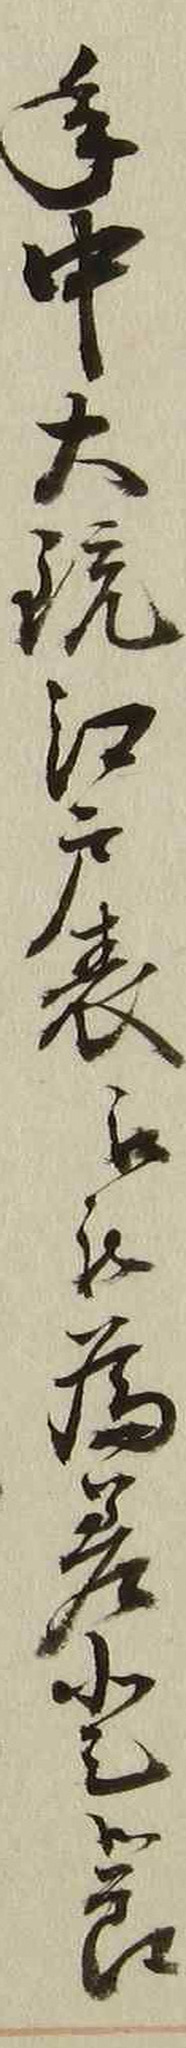年中大銃江戸表江被為差登節
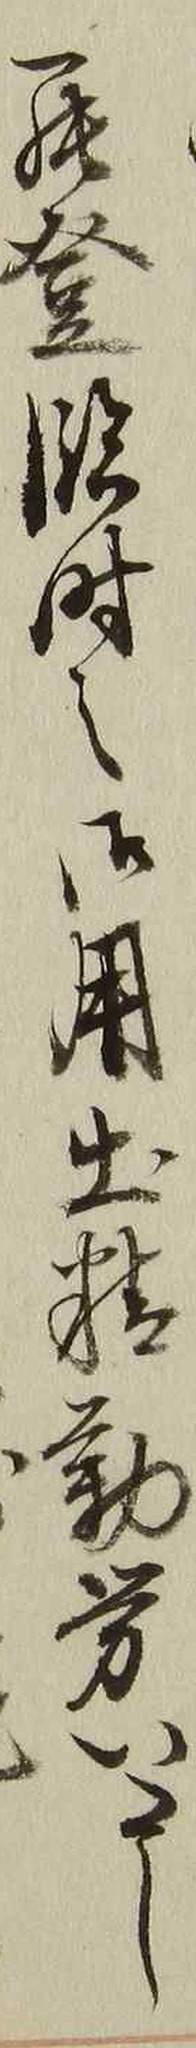罷登臨時之御用出精勤労いたし
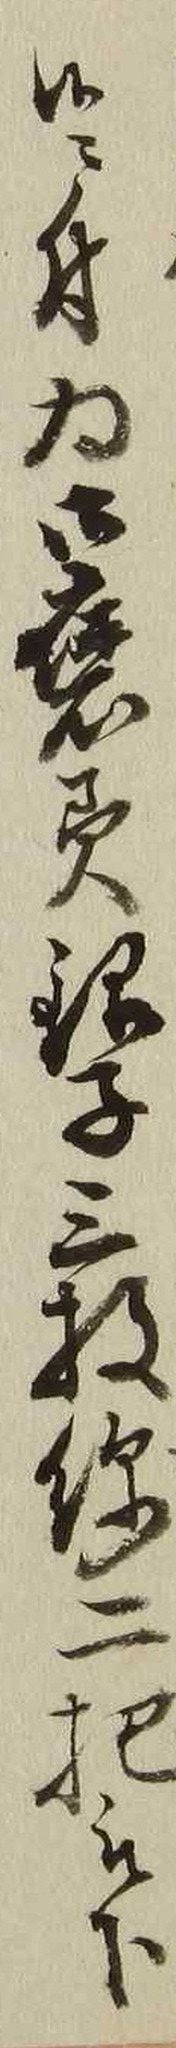候ニ付為御褒美銀子三枚綿二把被下
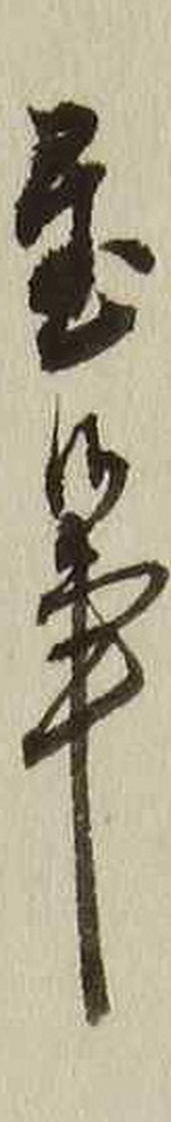置候事
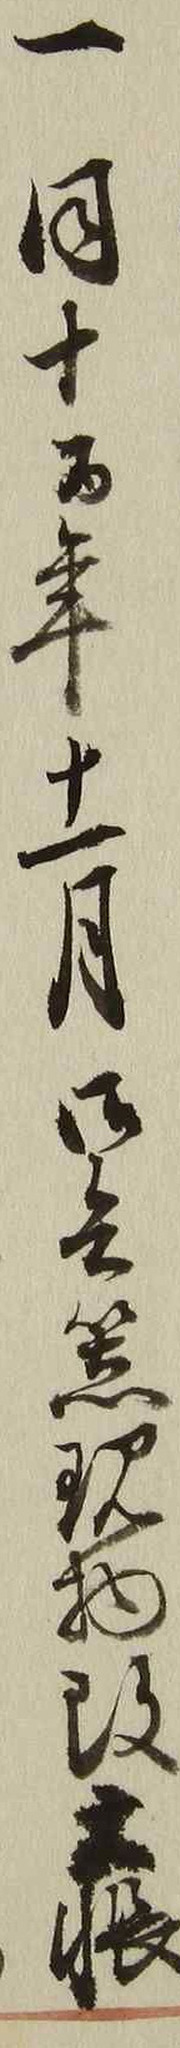一同十酉年十一月御兵器現物改大帳
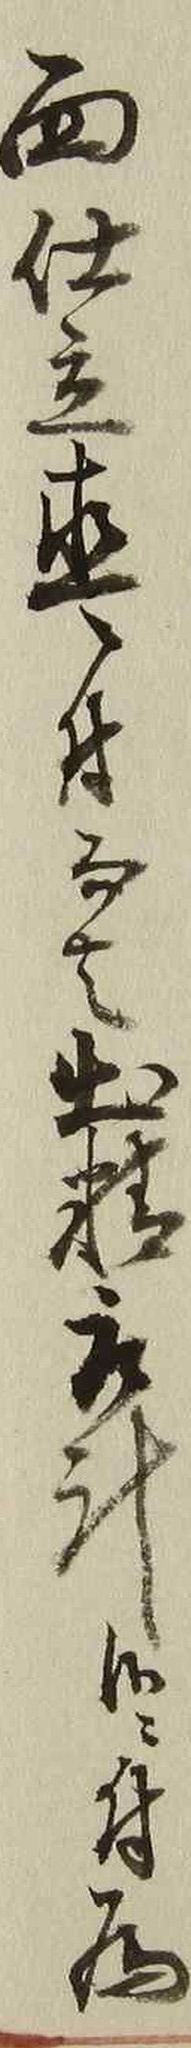面仕立直ニ付而者出精取計候ニ付為
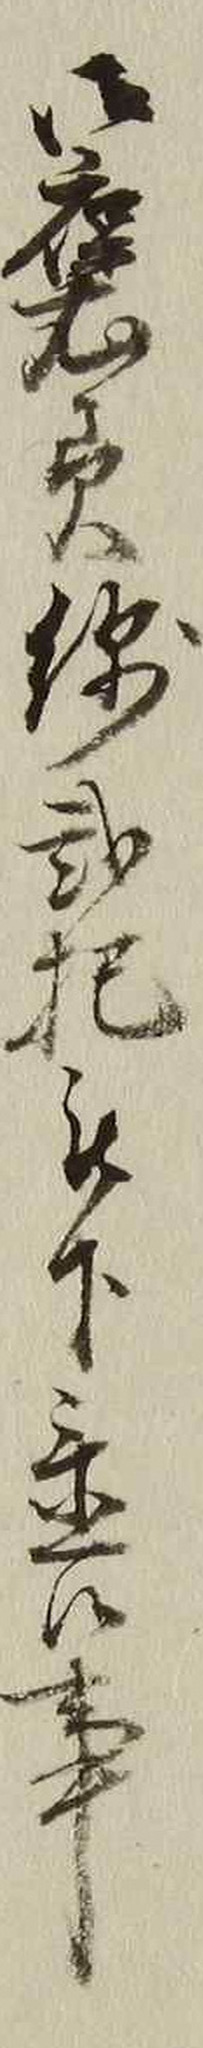御褒美綿弐把被下置候事
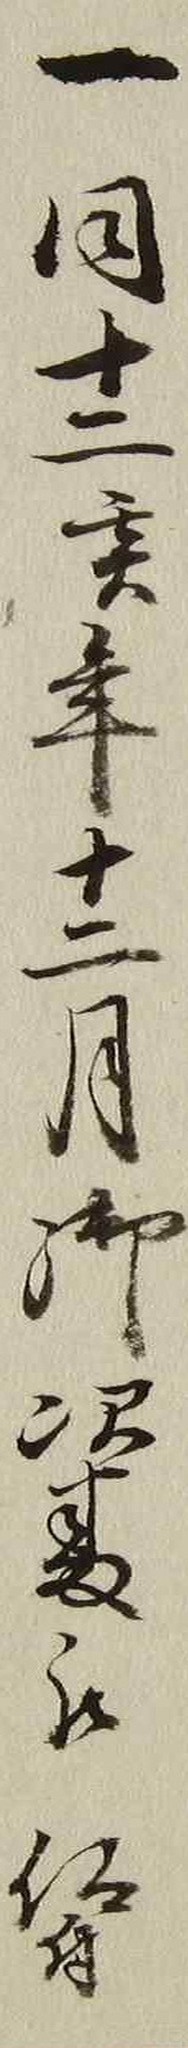一同十二亥年十二月御次番被仰付
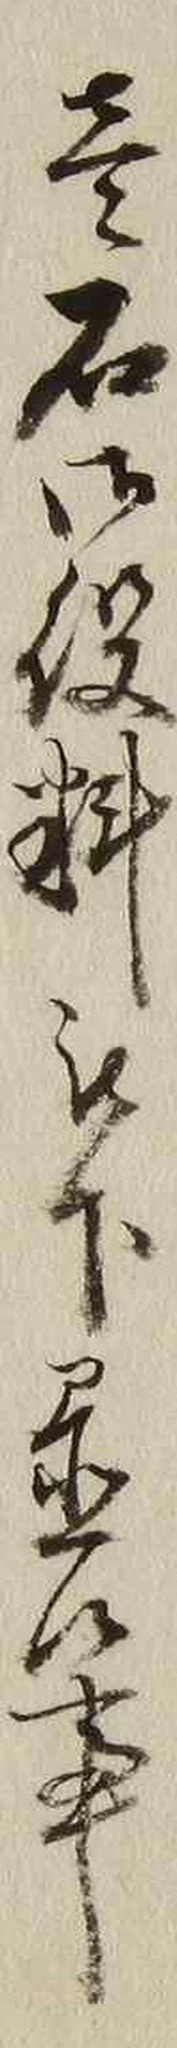壱石御役料被下置候事
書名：諸士系譜　巻之36　は之部4
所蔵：会津若松市立会津図書館
